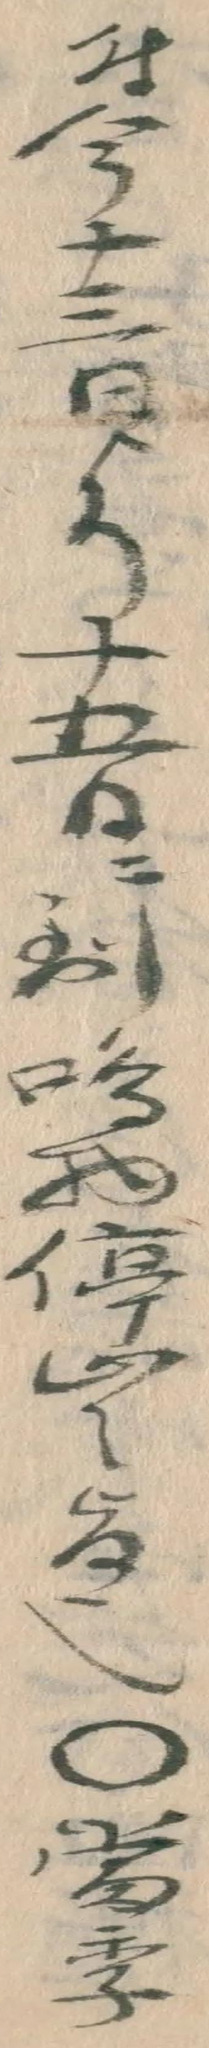付今十三日より十五日ニ到鳴物停止之旨也○當季
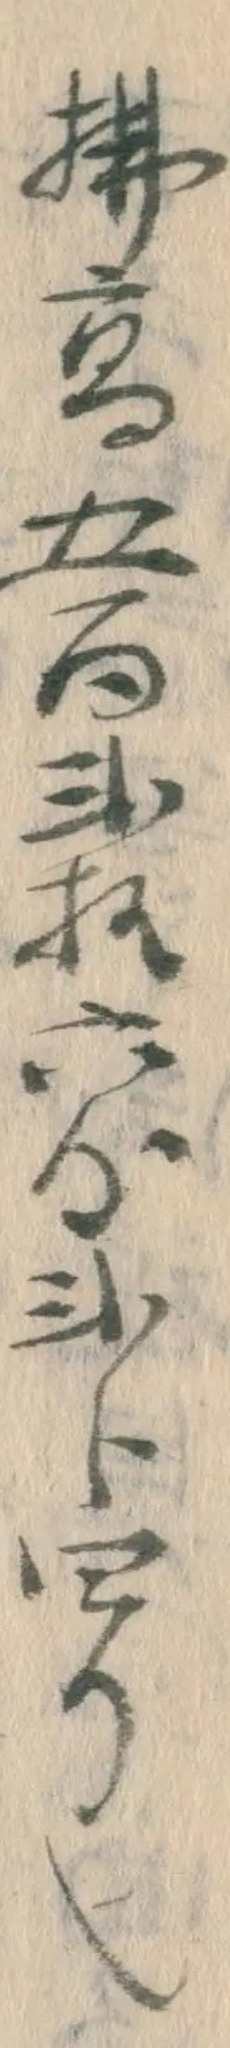払高九百弐拾六匁弐分四厘也
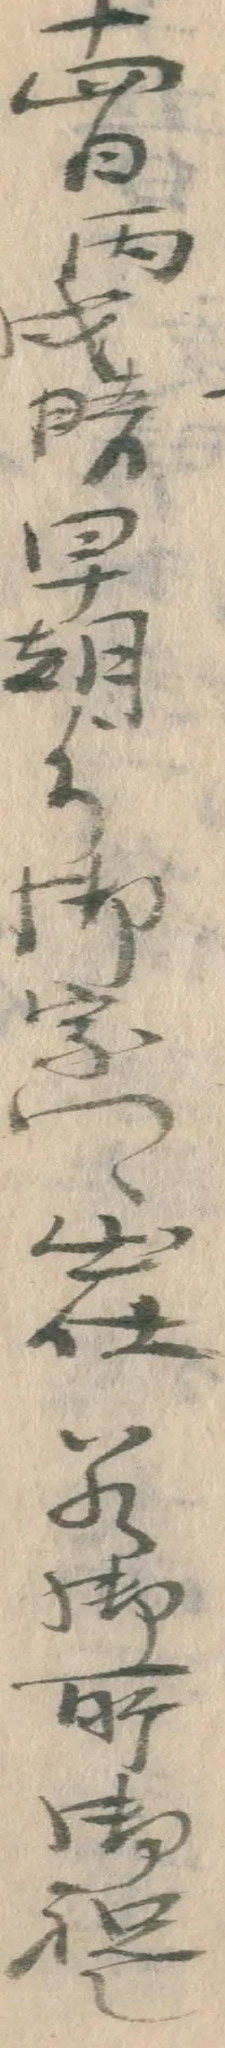十四日丙戌晴早朝より御家門へ出仕若御所御祝之
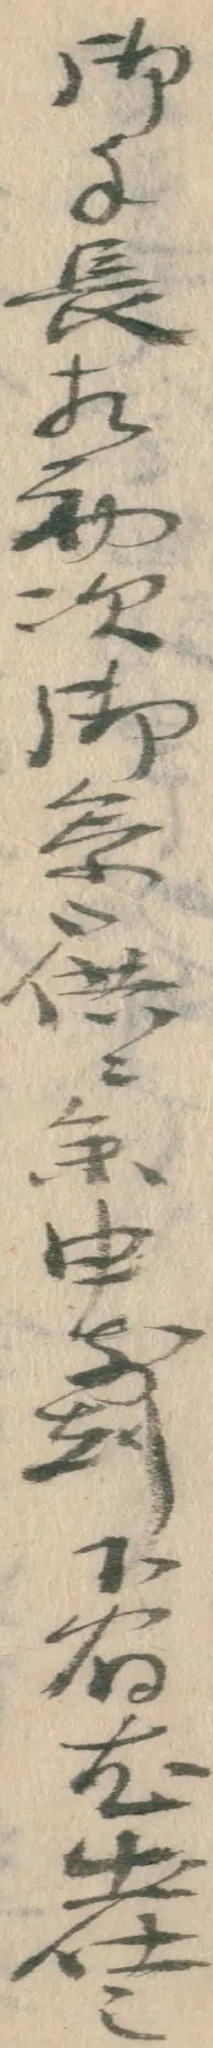御手長相勤次御参御供ニ参申前刻下宿尤出仕之
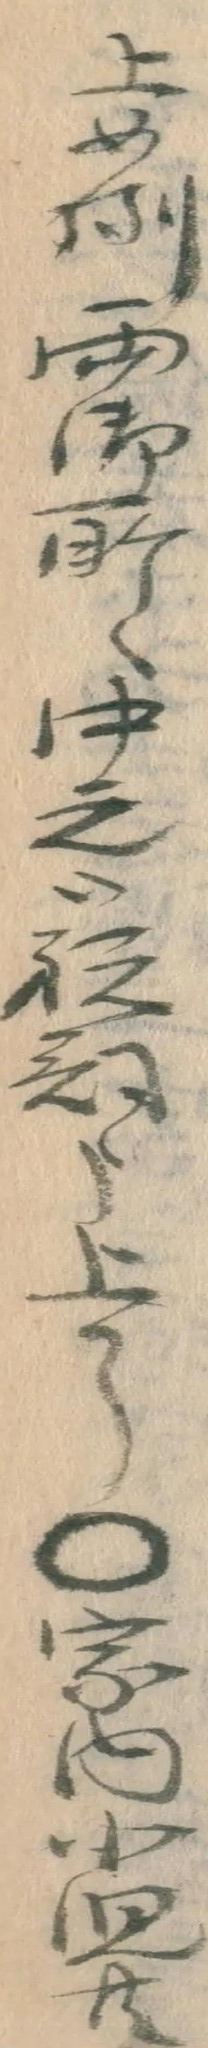上如例両御所へ中元御祝詞申上了〇家内小児共

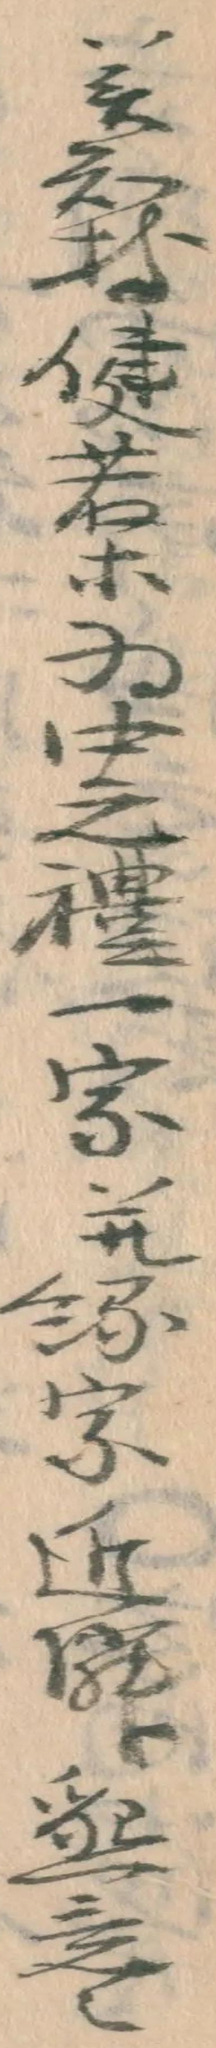美知村健若等為中之禮一家并縁家近隣ト懇意之
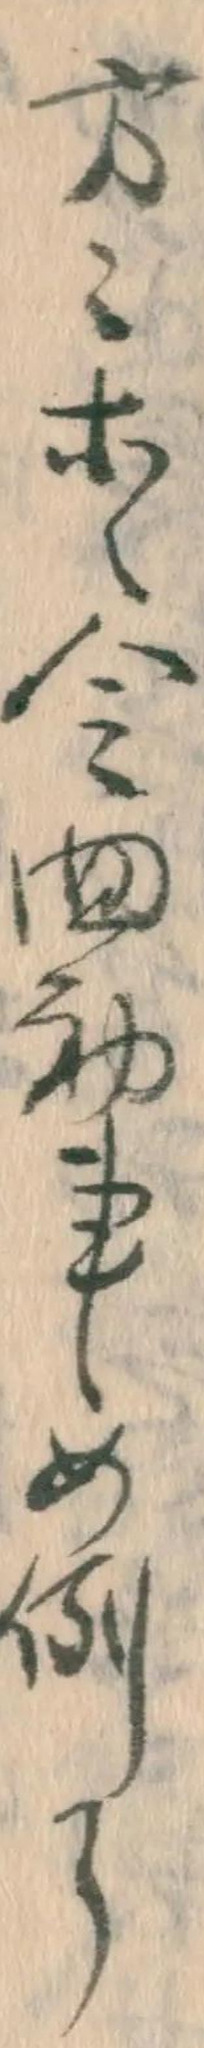方々等々令回勤事候如例了
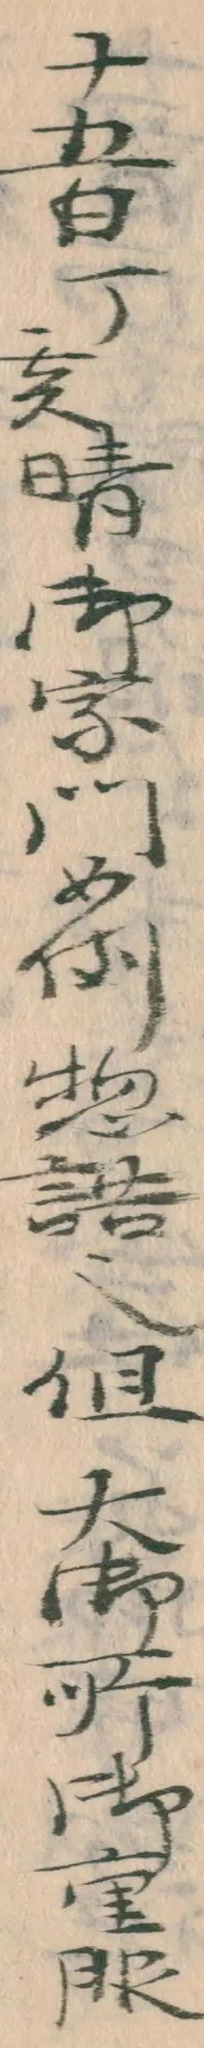十五日丁亥晴御家門如例惣詰也但大御所御重服
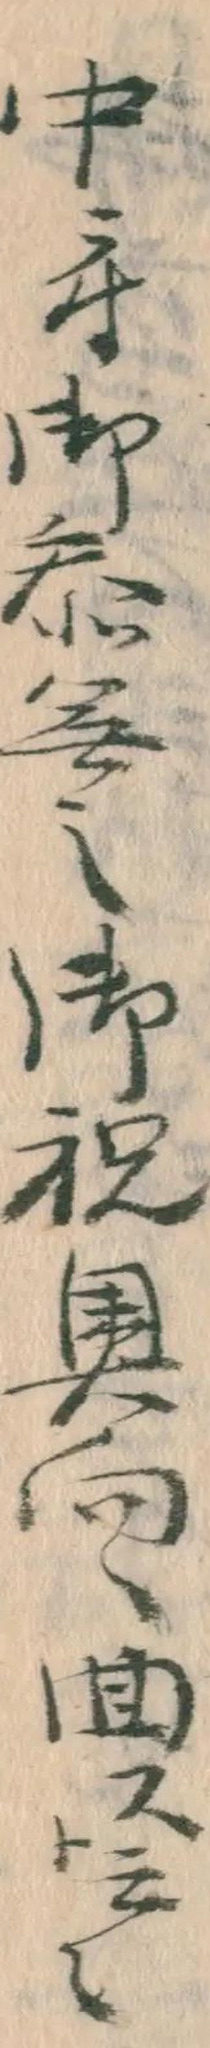中ニ付御参無之御祝奥向へ回スト云々
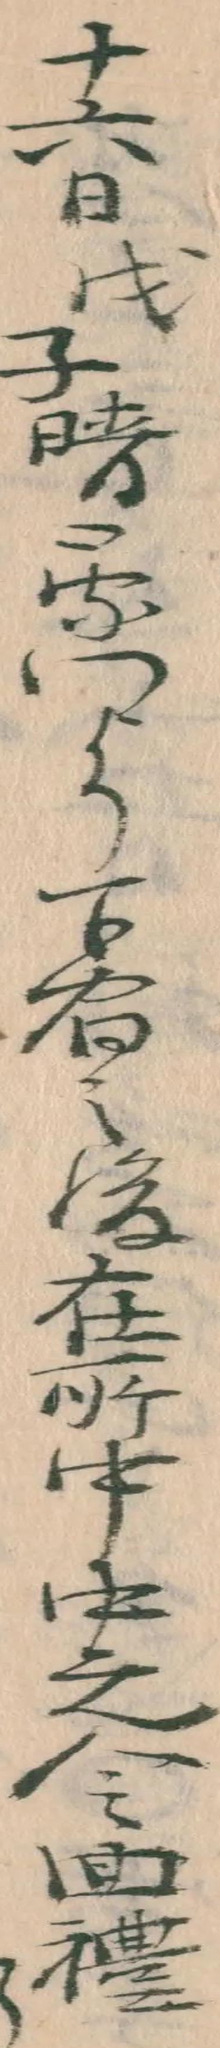十六日戊子晴御家門より下宿之後在所中中之人之回禮了
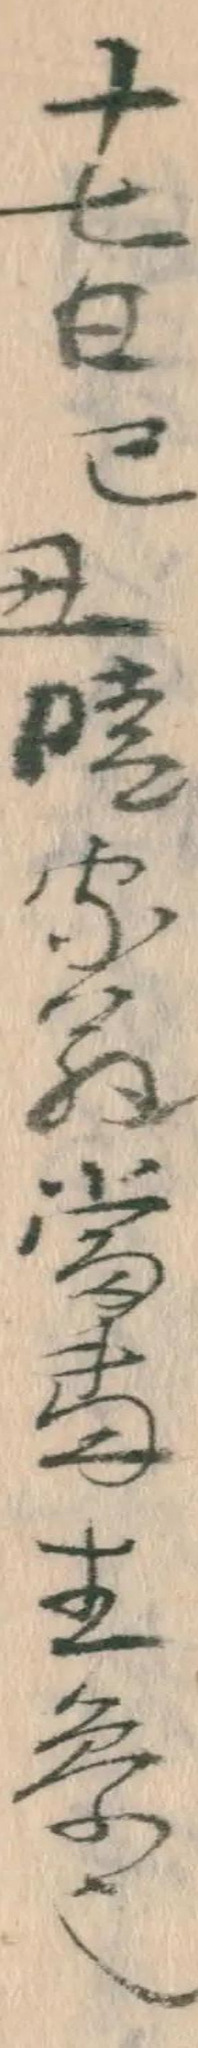十七日己丑晴家翁當番直参也
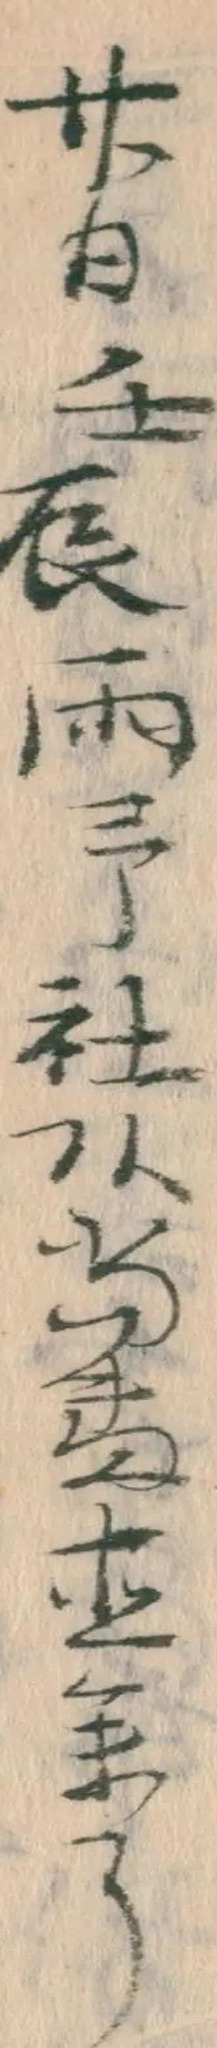廿日壬辰雨予社頭當番直参了
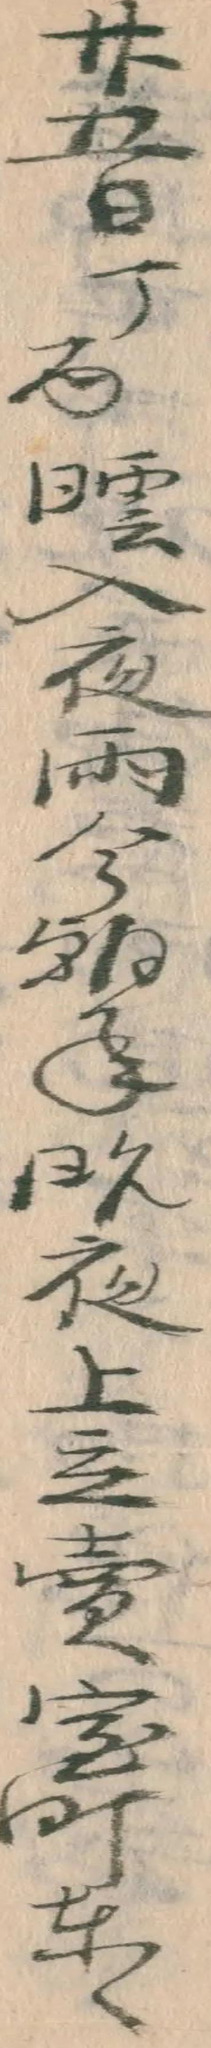廿五日丁酉曇入夜雨今朝承昨夜上之賣室町東へ
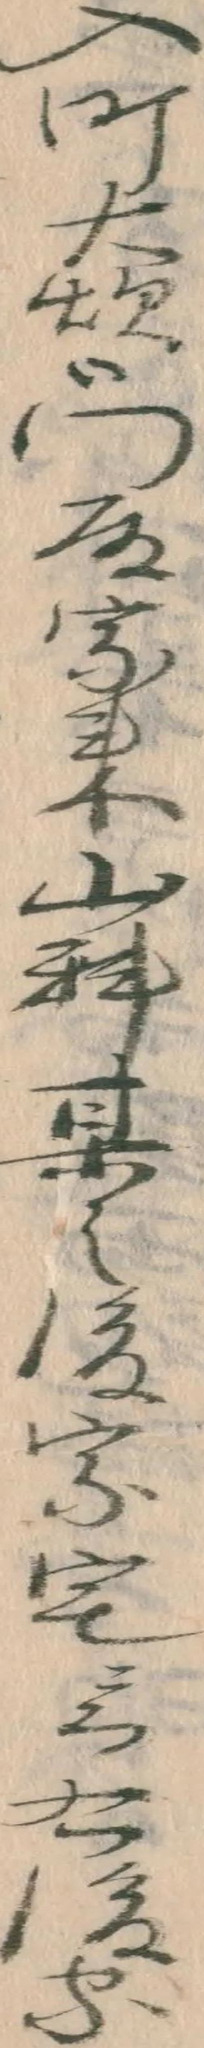入町大炊御門殿家来山科某之後家宅ニ而右後家
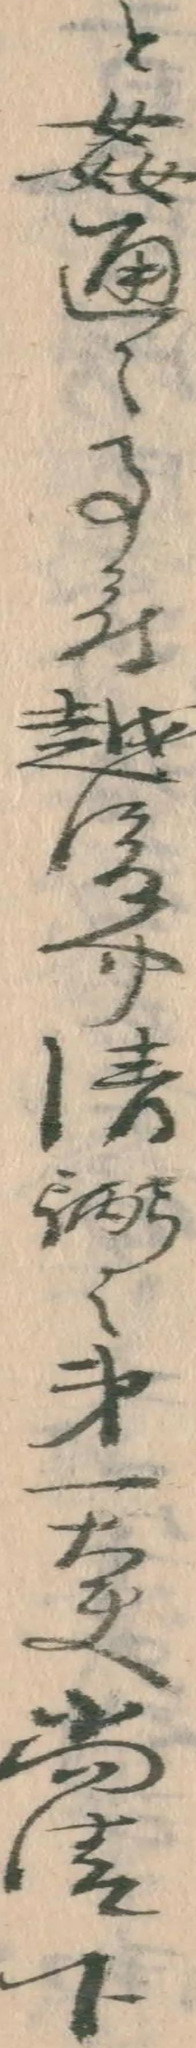と姦通之事ニ付越後介清弼之第一大夫尚清下
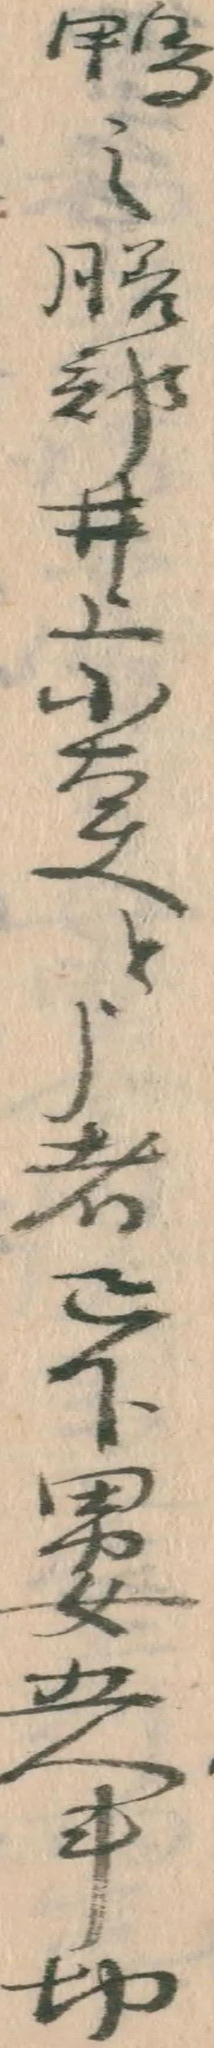鴨之膳部井上小太夫と申者已下男女五人斗切
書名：賀茂社記録. 第63冊
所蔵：国立国会図書館 National Diet Library, JAPAN
